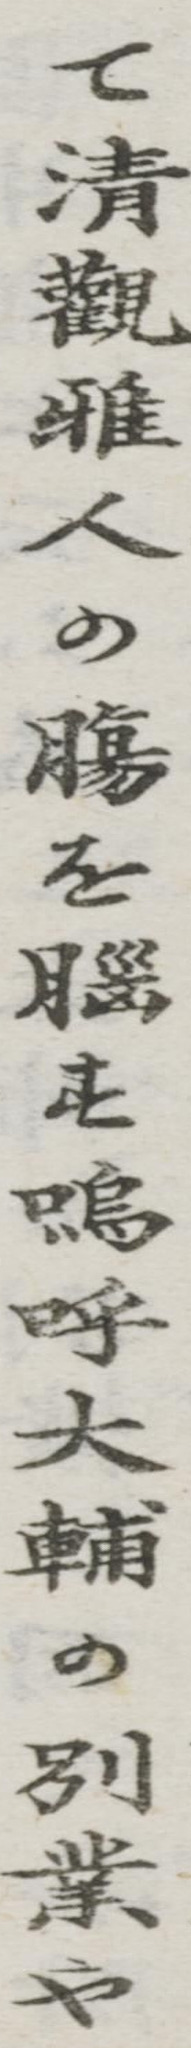て清観雅人の腸を悩す嗚呼大輔の別業や
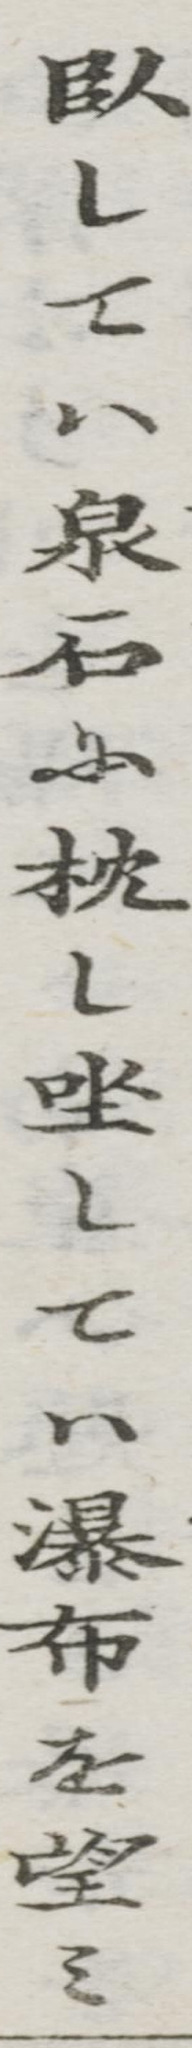臥しては泉石に枕し坐しては瀑布を望み
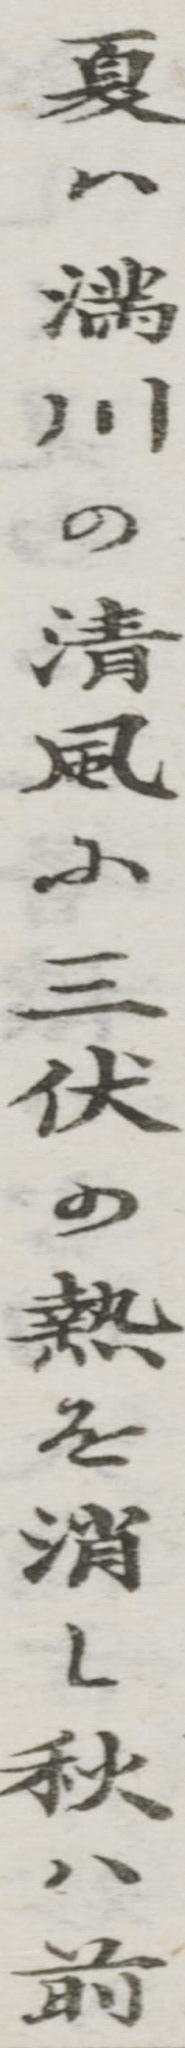夏は満川の清風に三伏の熱を消し秋は前
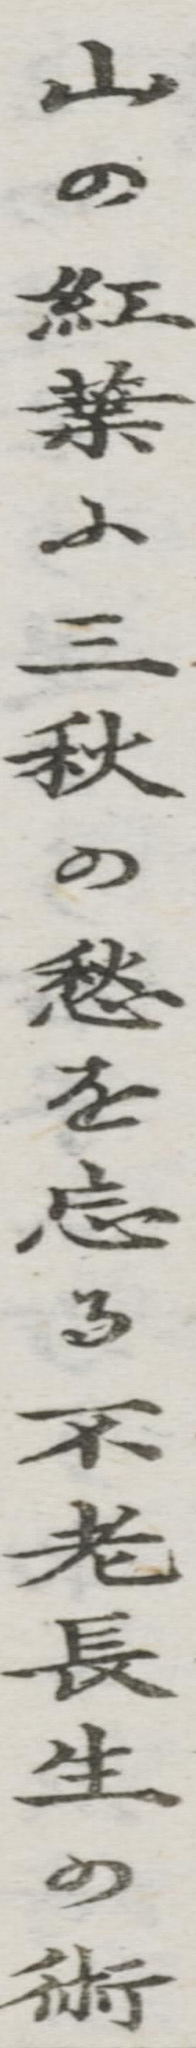山の紅葉に三秋の愁を忘る不老長生の術
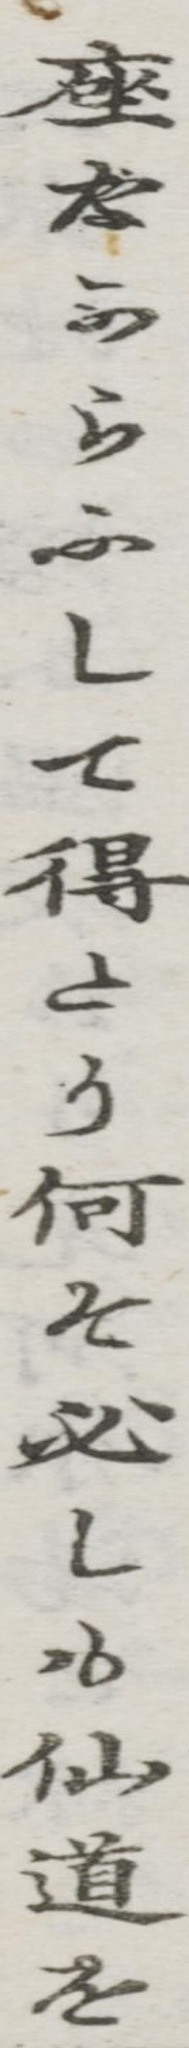座なからにして得たり何そ必しも仙道を
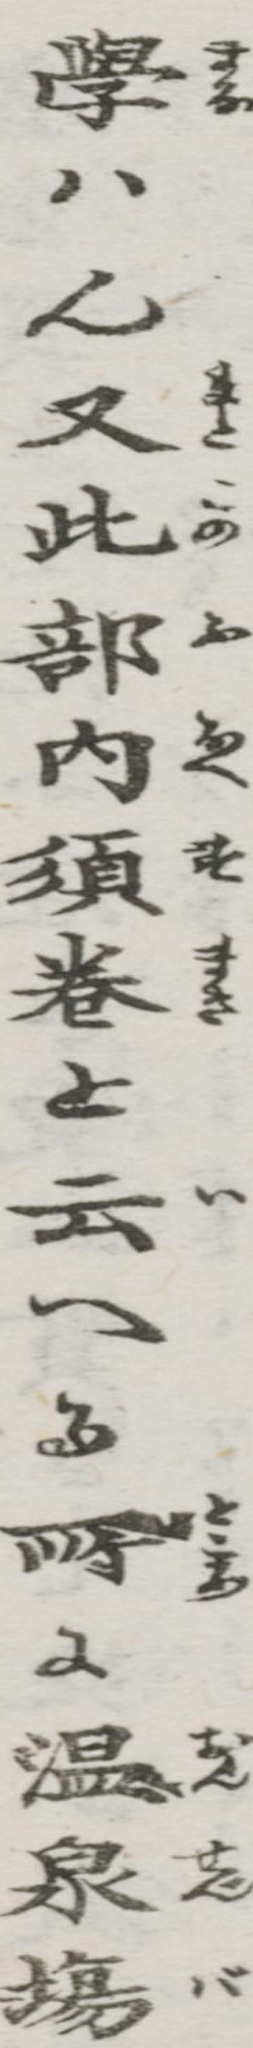学はん又此部内須巻と云へる所に温泉場
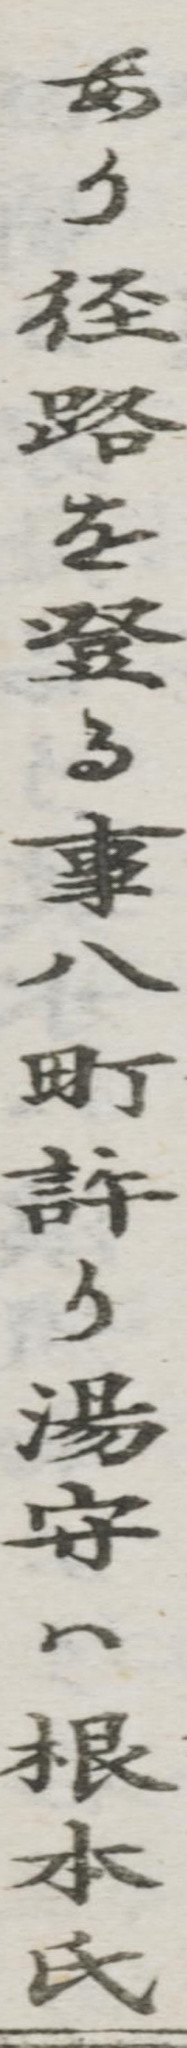あり径路を登る事八町許り湯守は根本氏
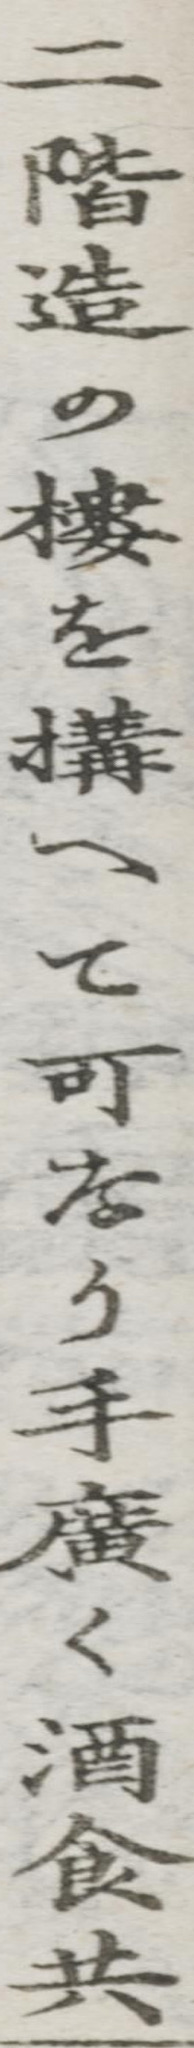二階造の樓を構へて可なり手廣く酒食共
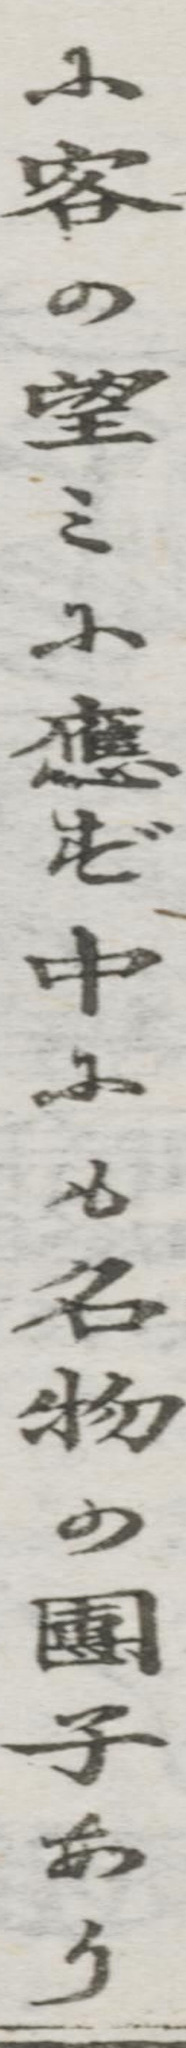に客の望みに応ず中にも名物の団子あり
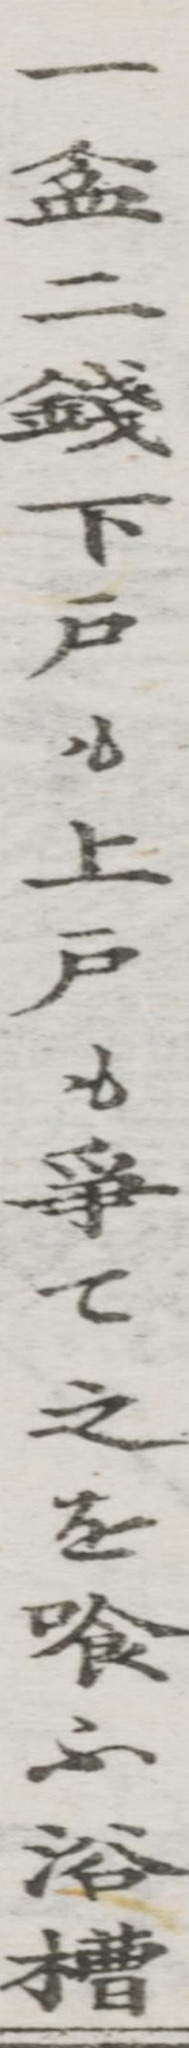一盆二錢下戸も上戸も争て之を喰ふ浴槽
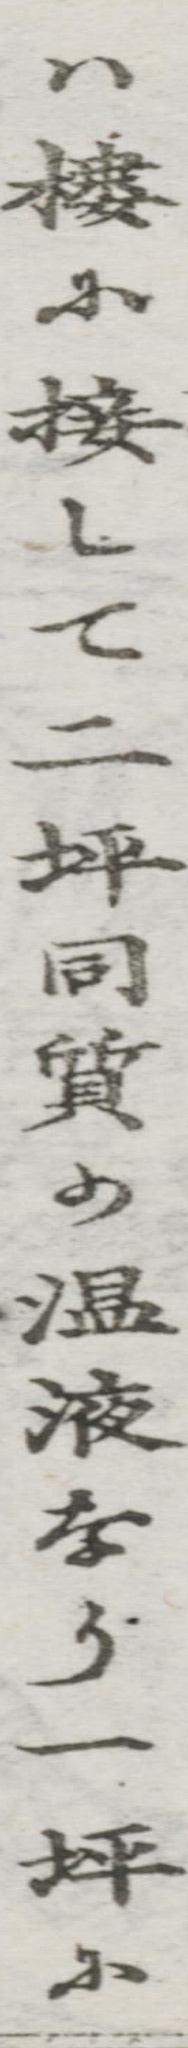は樓に接して二坪同質の温液なり一坪に
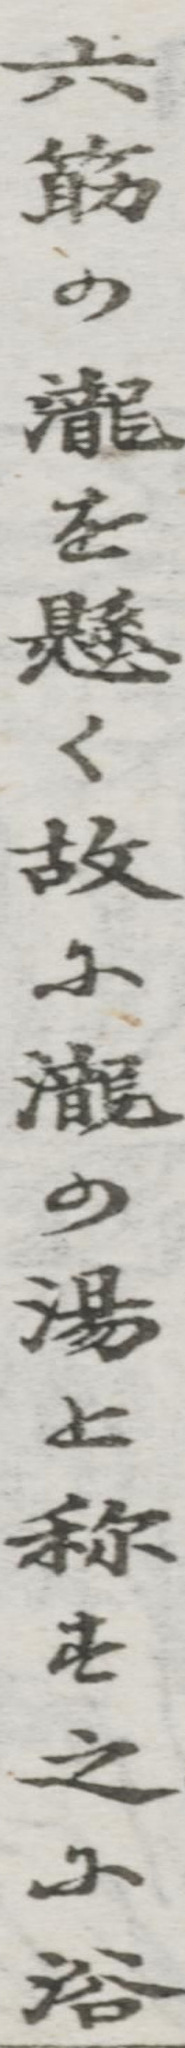六筋の瀧を懸く故に瀧の湯と称す之に浴
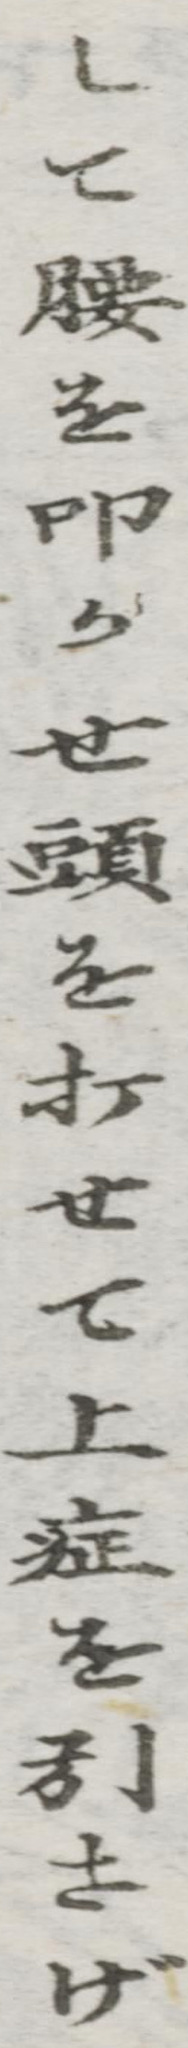して腰を叩かせ頭を打せて上症を引さげ
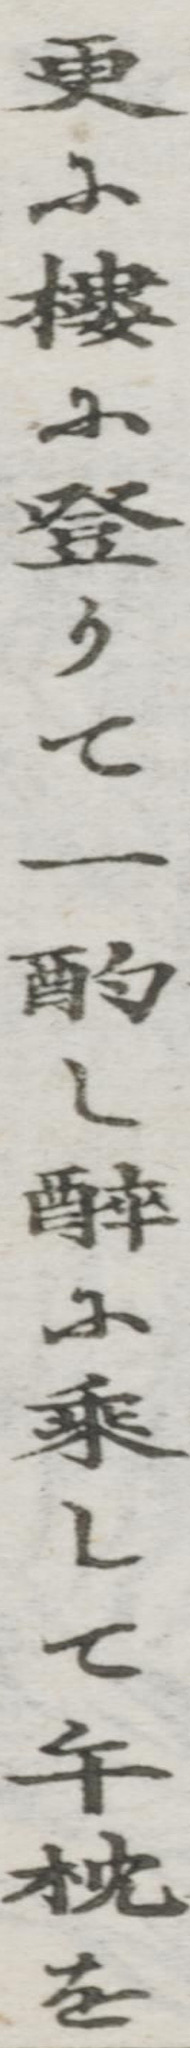更に樓に登てり一酌し酔に乗して午枕を
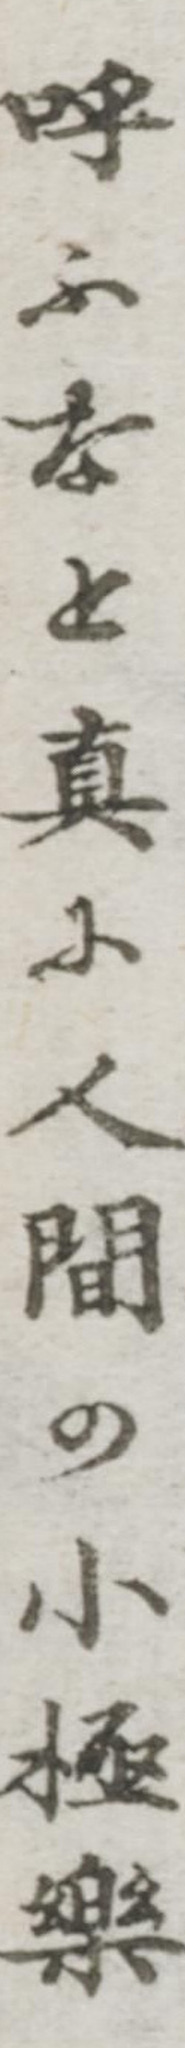呼ふなと真に人間の小極楽

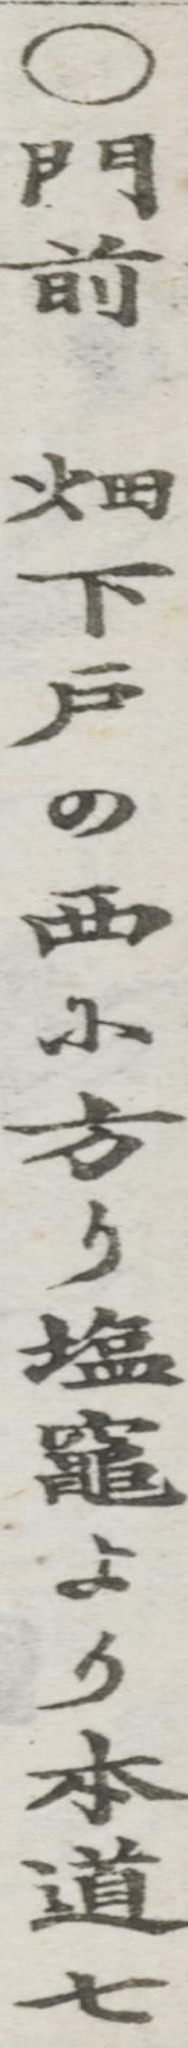○門前畑下戸の西に方り塩竈より本道七
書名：塩原繁昌記　全
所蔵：東京大学地震研究所図書室 Earthquake Research Institute Library, The University of Tokyo, JAPAN
